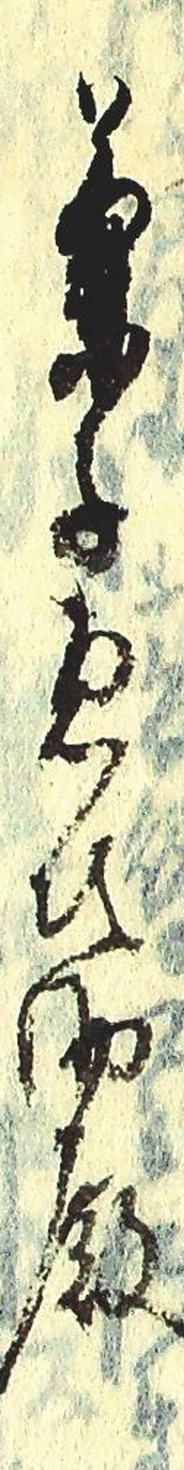兼子恵次助殿
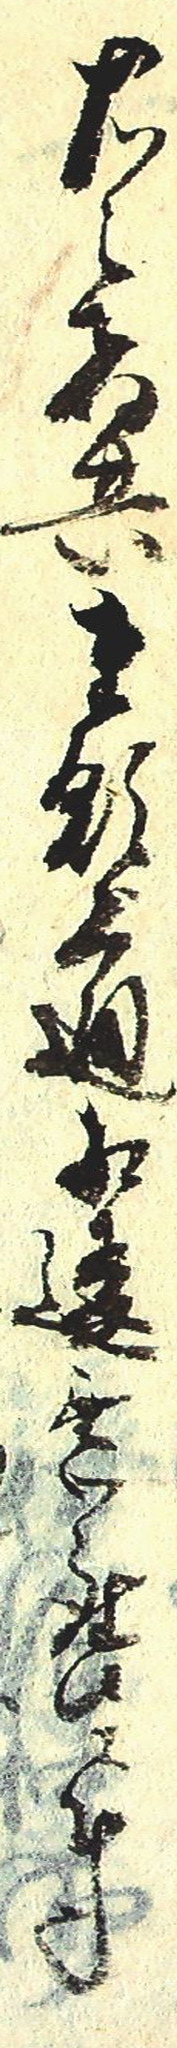右之者共奉願上通相違無御座候に付
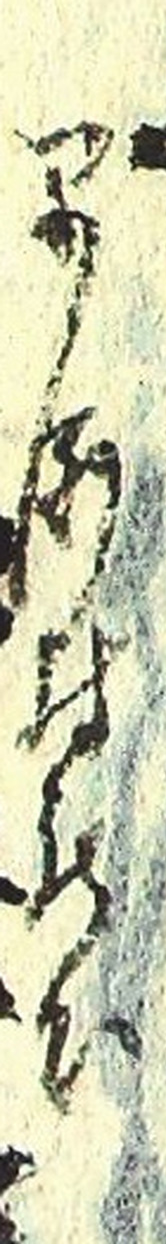早淵村庄屋
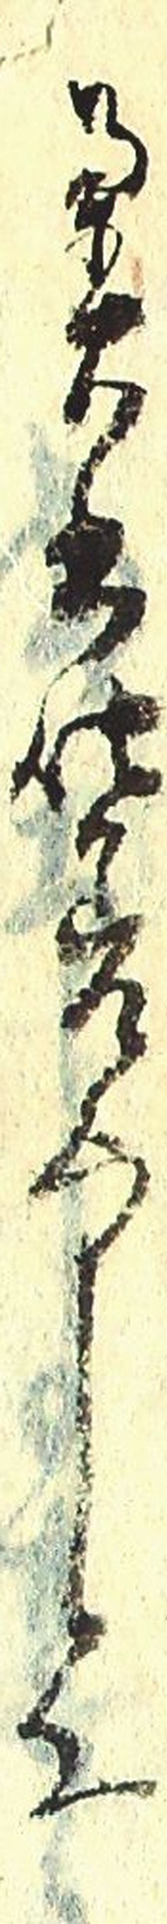奥書仕差上申候以上
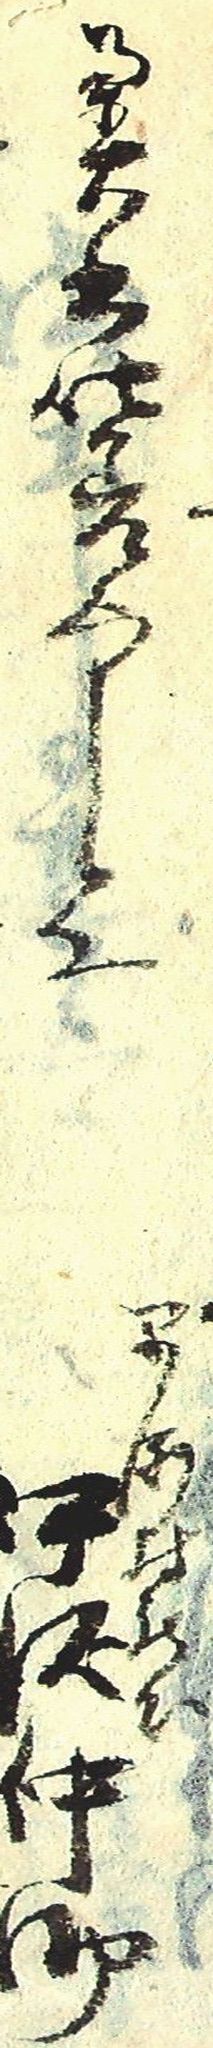奥書仕差上申候以上
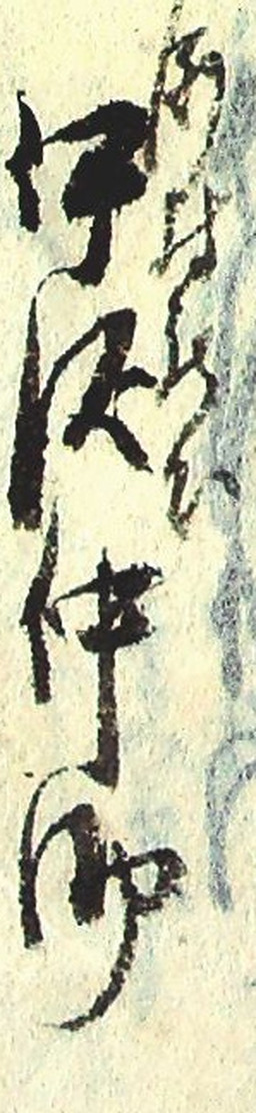伊沢仲助
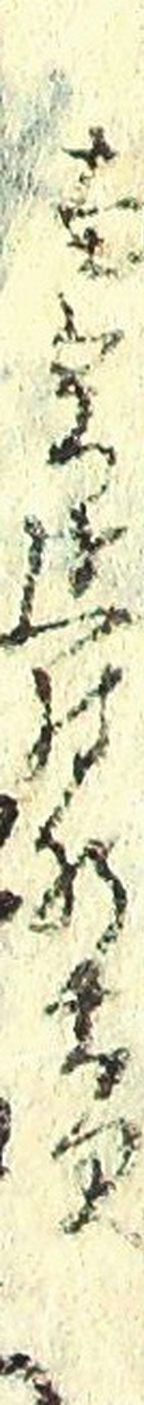南岩延村肝煎
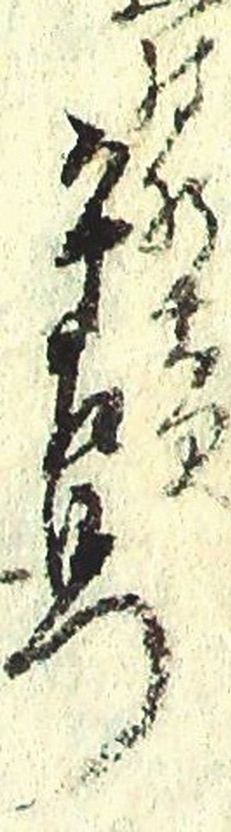平左衛門
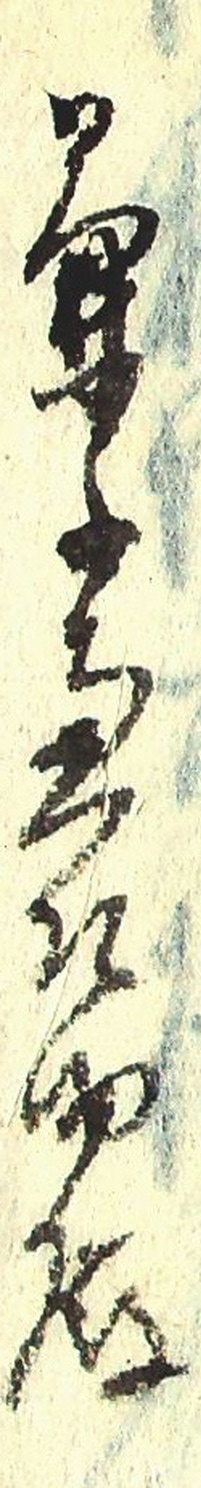兼子恵次助殿

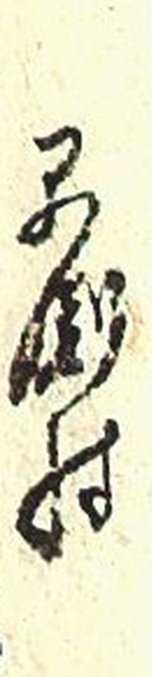早淵村
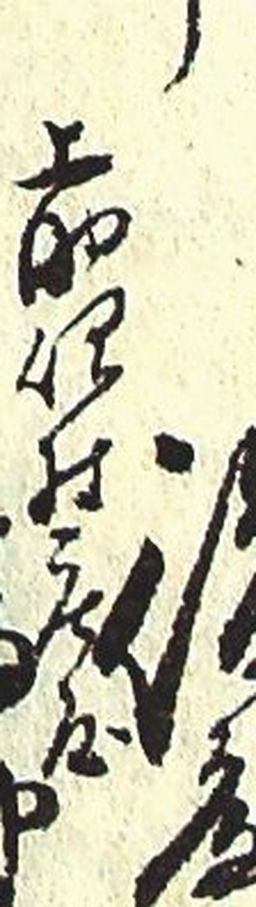上助任村庄屋
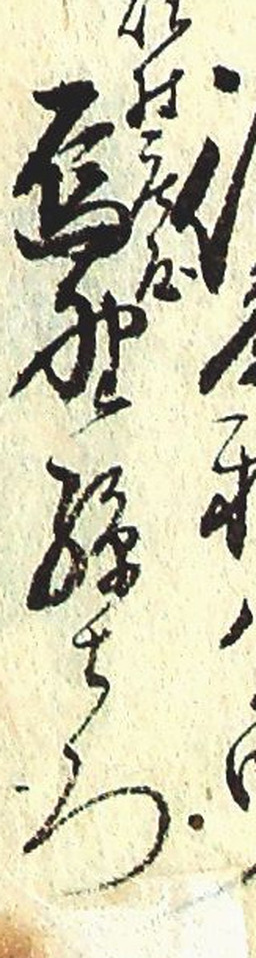烏野孫右衛門
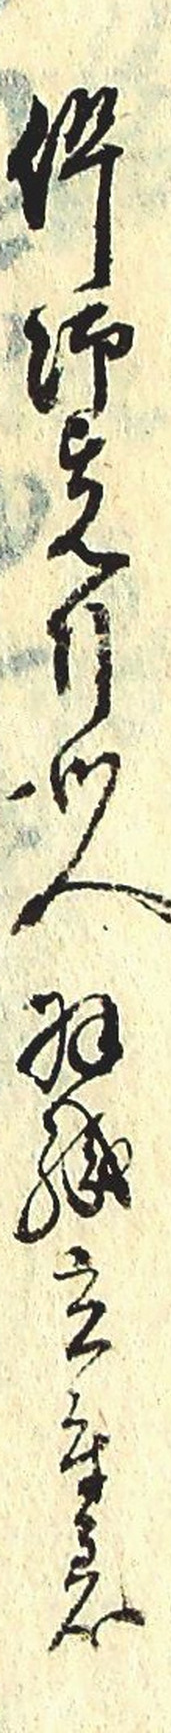但し御先行弐人羽織立付着
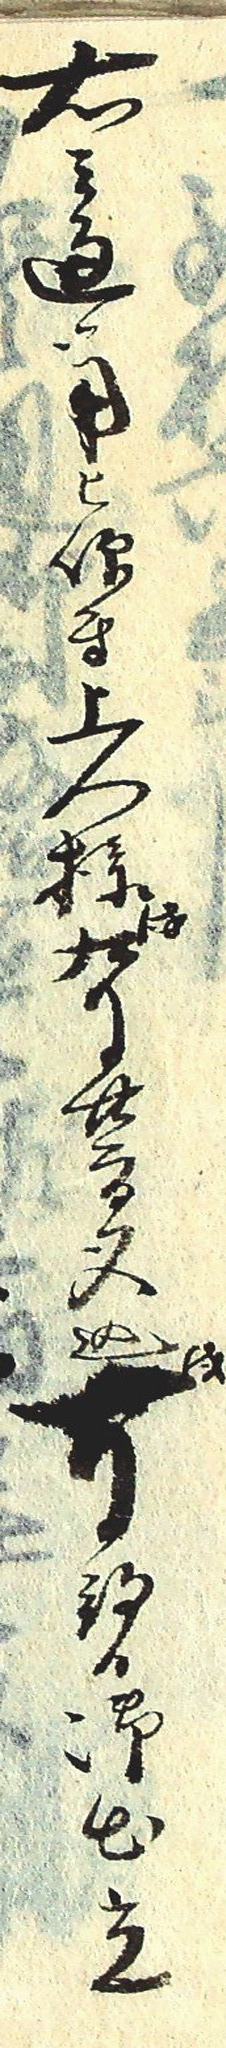右之通御用被仰付上人様戌九月廿二日御入込戌十月朔日御出立
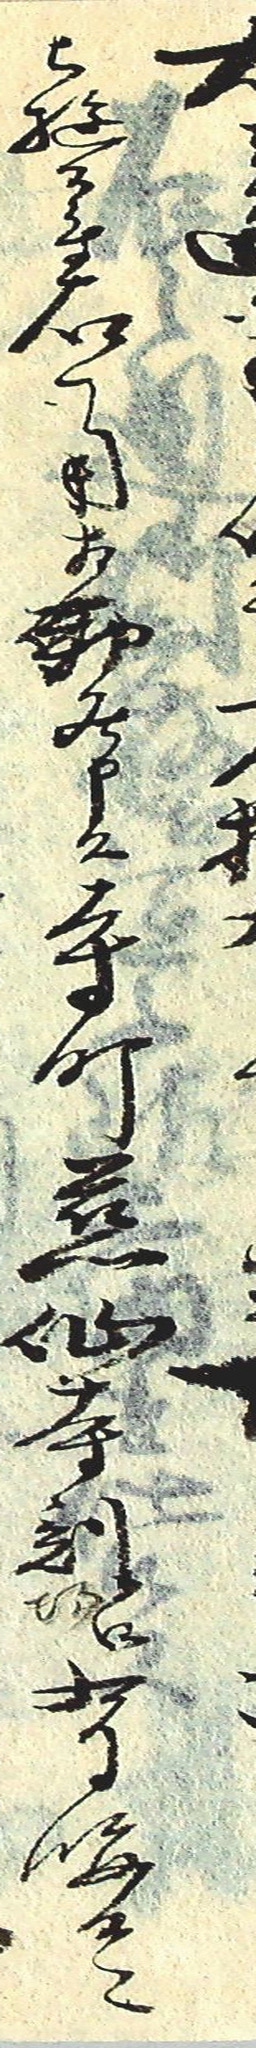被遊候付右御用相勤居申候寺町慈仙寺割場え九月晦日に
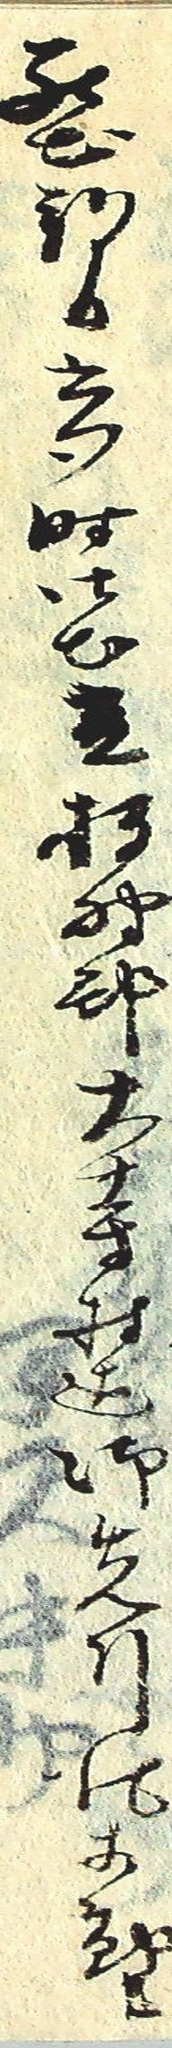罷出朔日六つ時御出立板野郡大寺村迄御先行仕相勤候
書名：諸御願書控(弐番）
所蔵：鳴門教育大学 Naruto University of Education
